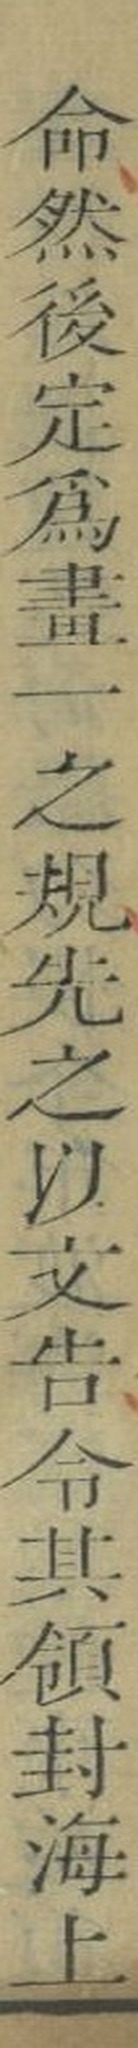命然後定為画一之規先之以文告令其領封海上
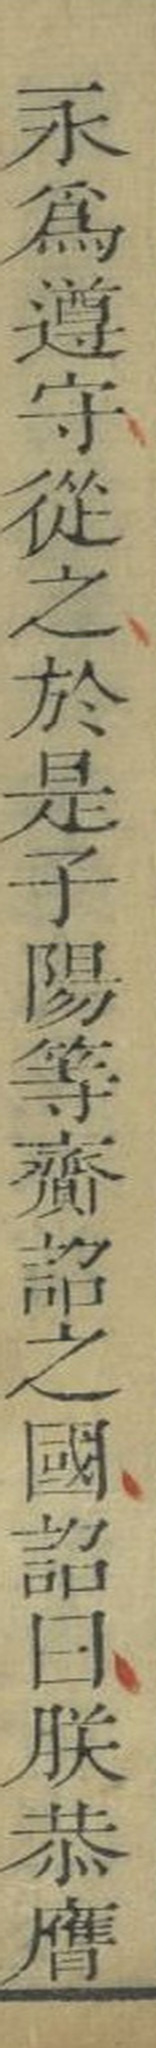永為遵守従之於是子陽等齎詔之国詔曰朕恭膺
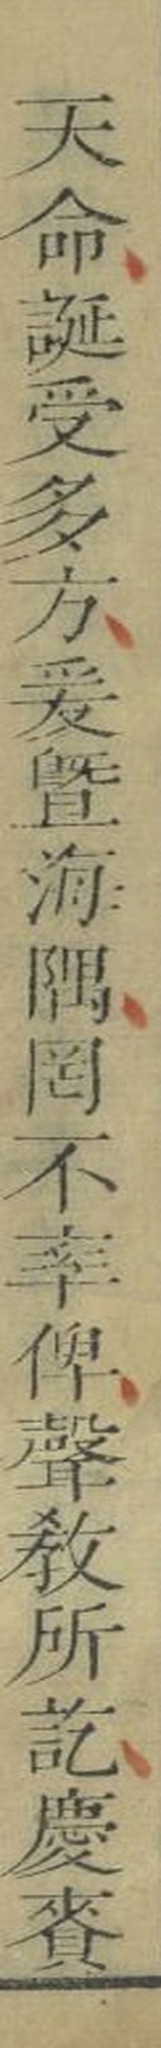天命誕受多方爰曁海隅罔不率俾声教所訖慶賚
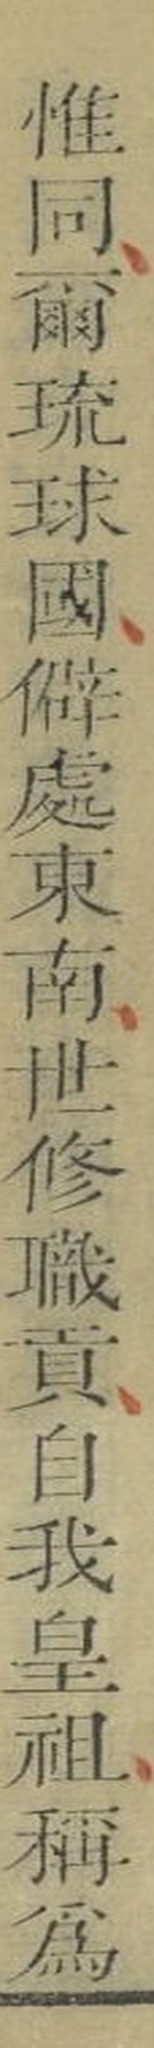惟同爾琉球国僻処東南世修職貢自我皇祖称為
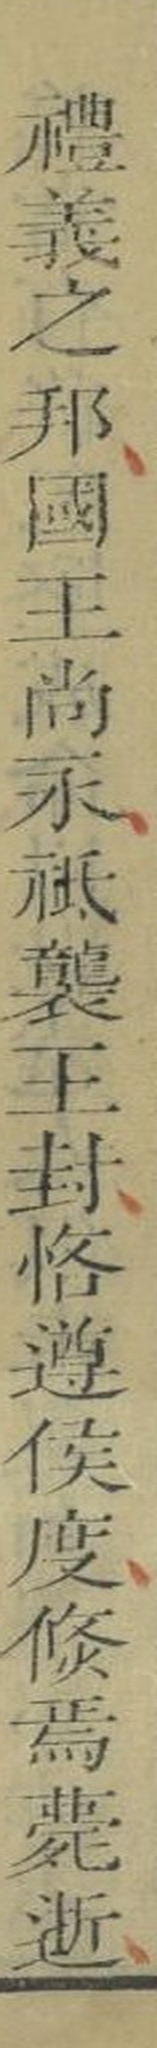礼義之邦国王尚永祇襲王封恪遵侯度倐焉薨逝
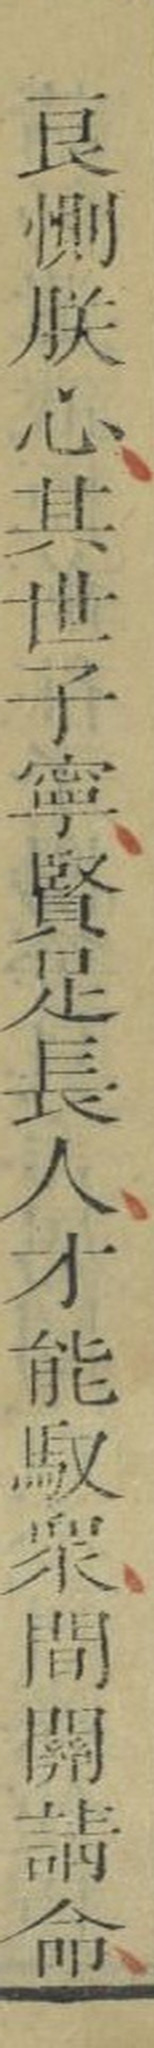良惻朕心其世子寧賢足長人才能馭衆間関請命
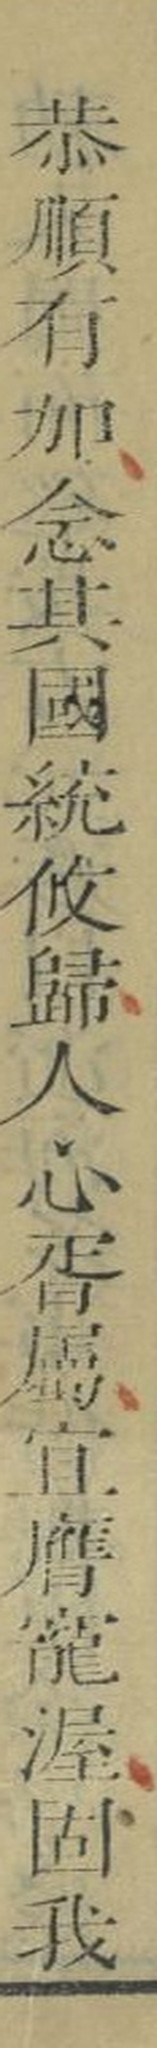恭順有加念其国統攸帰人心胥属宜膺寵渥固我
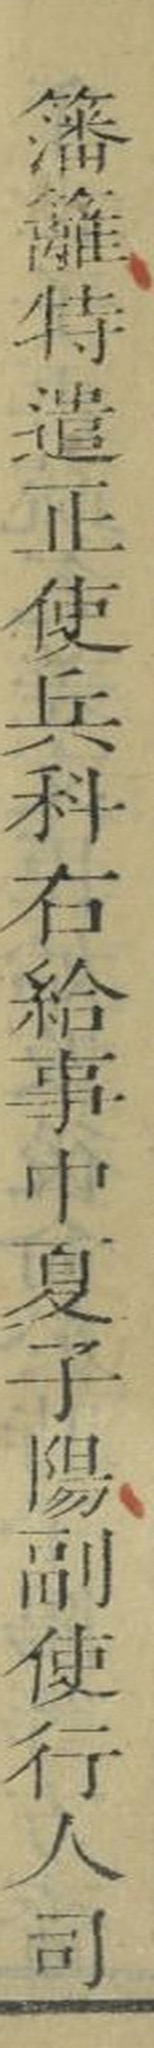籓籬特遣正使兵科右給事中夏子陽副使行人司
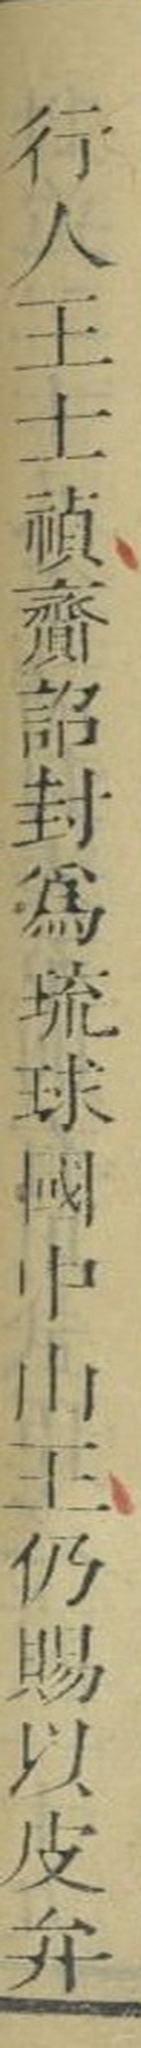行人王士禎齎詔封為琉球国中山王仍賜以皮弁
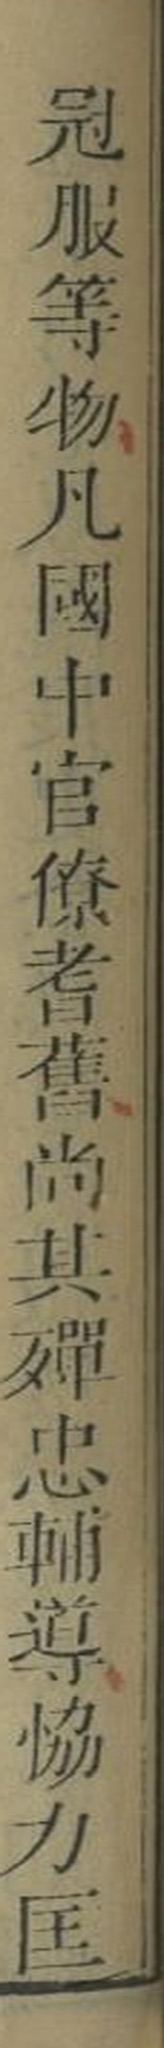冠服等物凡国中官僚耆旧尚其殫忠輔導恊力匡
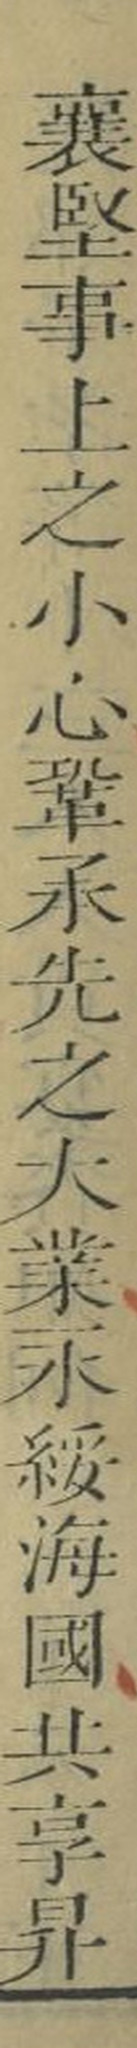襄堅事上之小心鞏承先之大業永綏海国共享昇
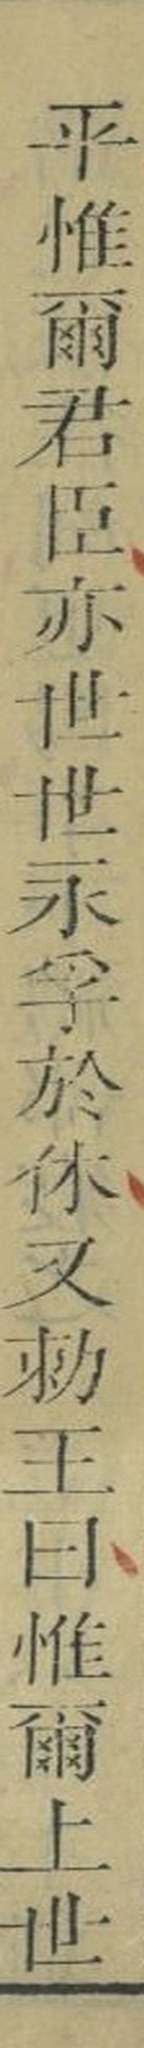平惟爾君臣亦世世永孚於休又勅王曰惟爾上世
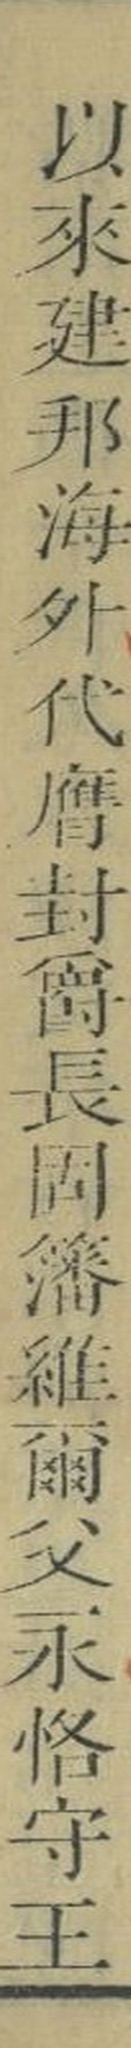以来建邦海外代膺封爵長固籓維爾父永恪守王
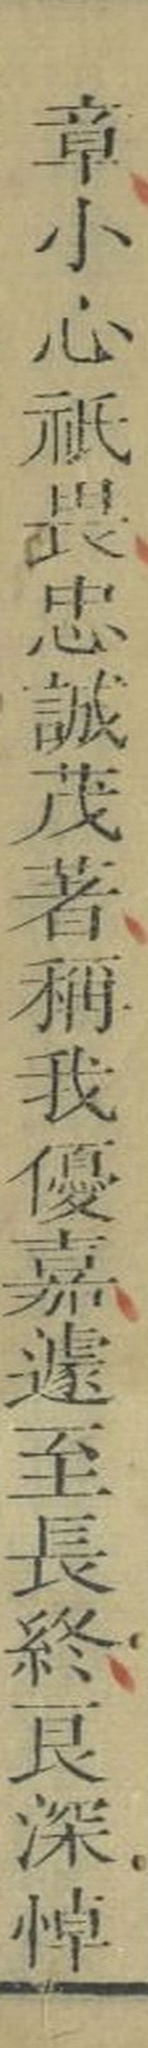章小心祇畏忠誠茂著称我優嘉遽至長終良深悼
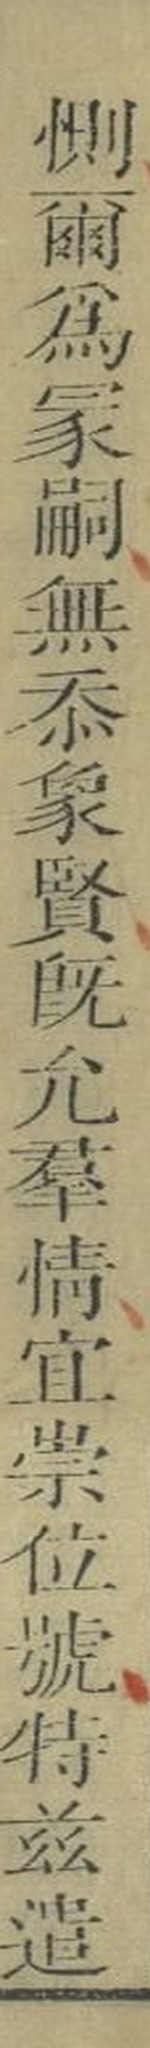惻爾為冡嗣無忝象賢既允群情宜崇位号特茲遣
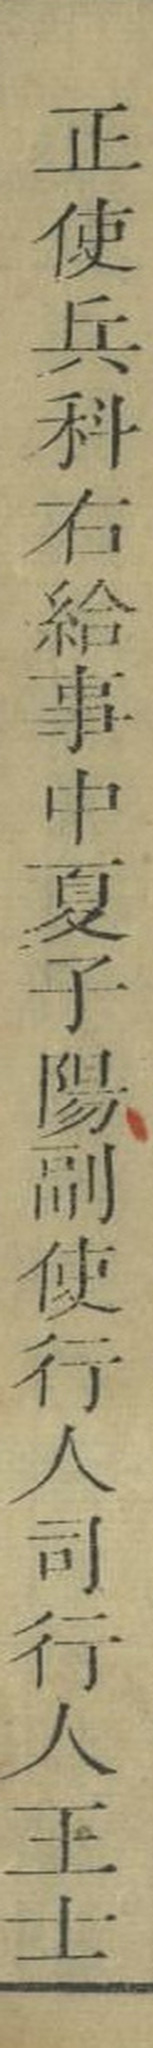正使兵科右給事中夏子陽副使行人司行人王士
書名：中山伝信録 巻三
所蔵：University of the Ryukyus Library
